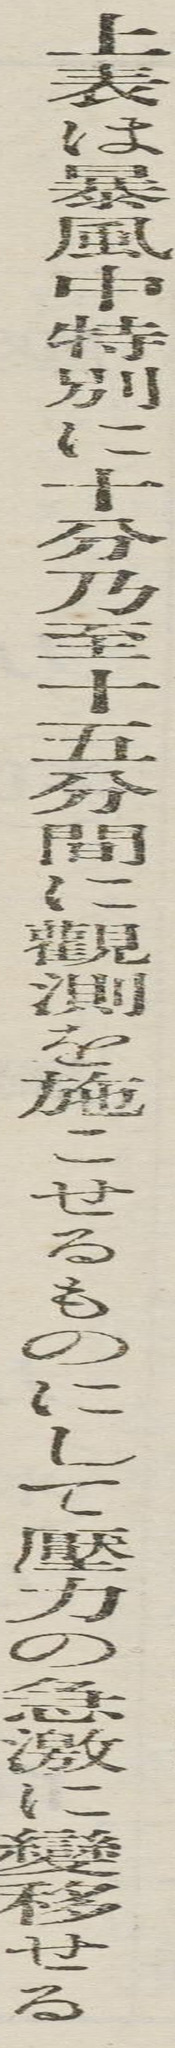上表は暴風中特別に十分乃至十五分間に観測を施こせるものにして圧力の急激に変移せる
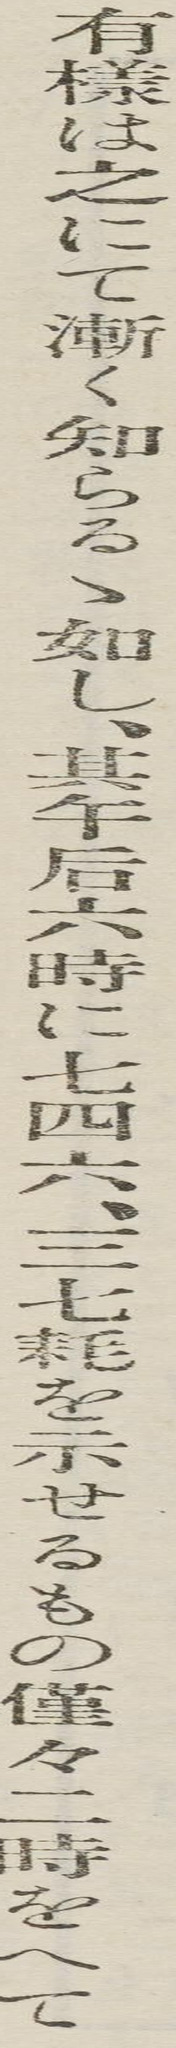有様は之にて漸く知らるゝ如し、其午后六時に七四六、三七粍を示せるもの僅々二時をへて
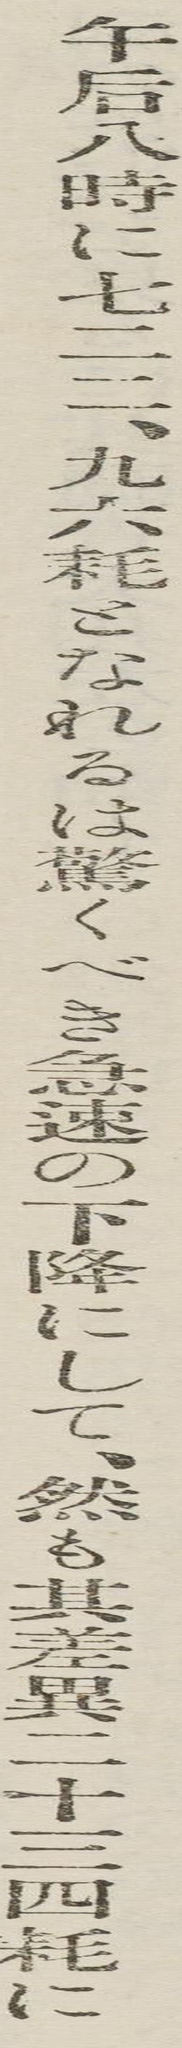午后八時に七二二、九六粍となれるは驚くべき急速の下降にして、然も其差異二十三四粍に
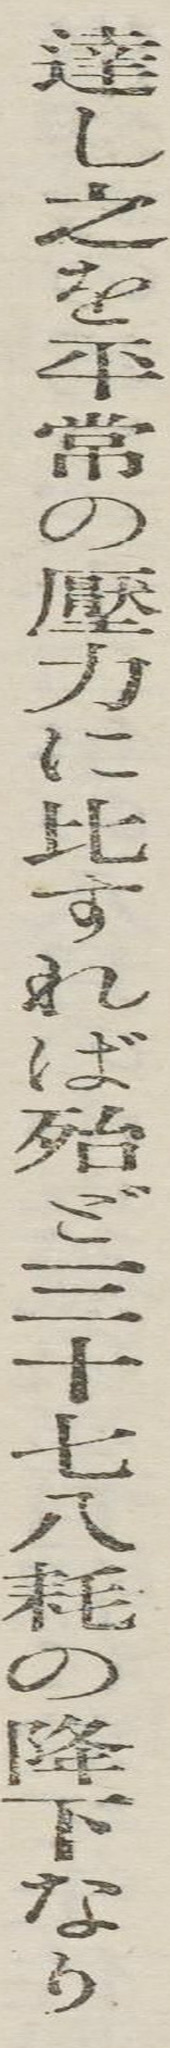達し之を平常の圧力に比すれば殆ど三十七八粍の降下なり
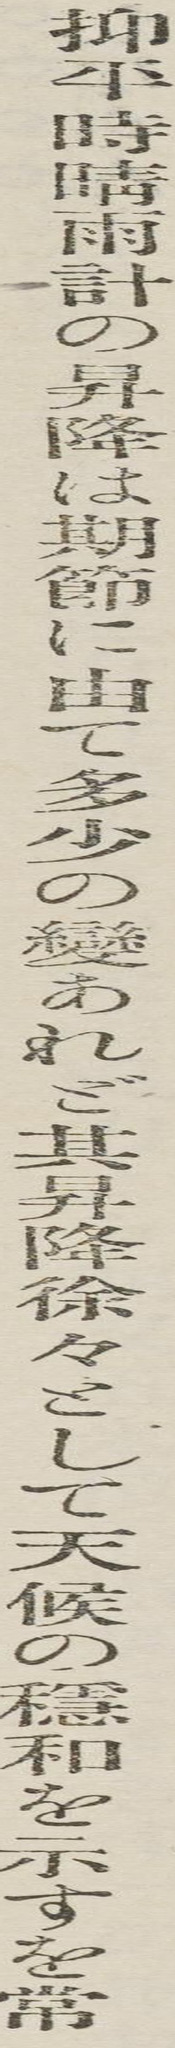抑平時晴雨計の昇降は期節に由て多少の変あれど其昇降徐々として天候の穏和を示すを常
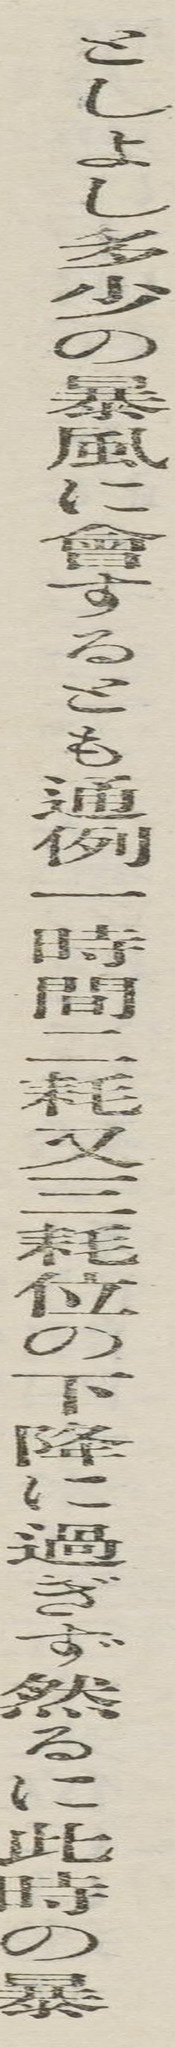としよし多少の暴風に会するとも通例一時間二粍又三粍位の下降に過ぎず然るに此時の暴
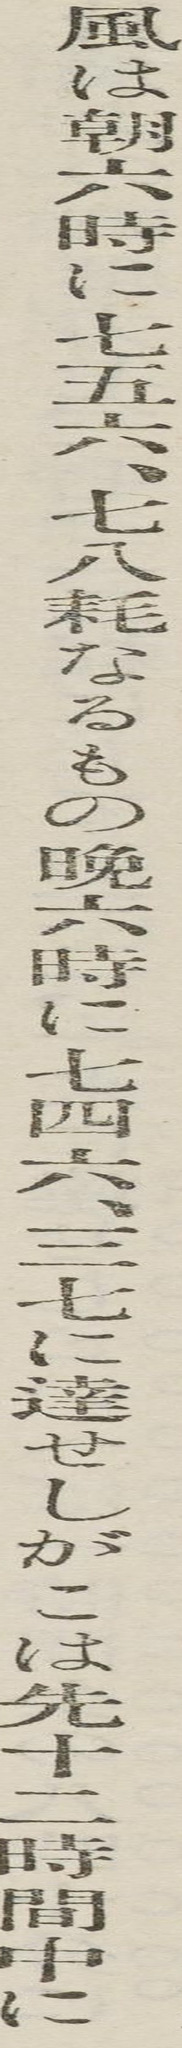風は朝六時に七五六、七八粍なるもの晩六時に七四六、三七に達せしがこは先十二時間中に
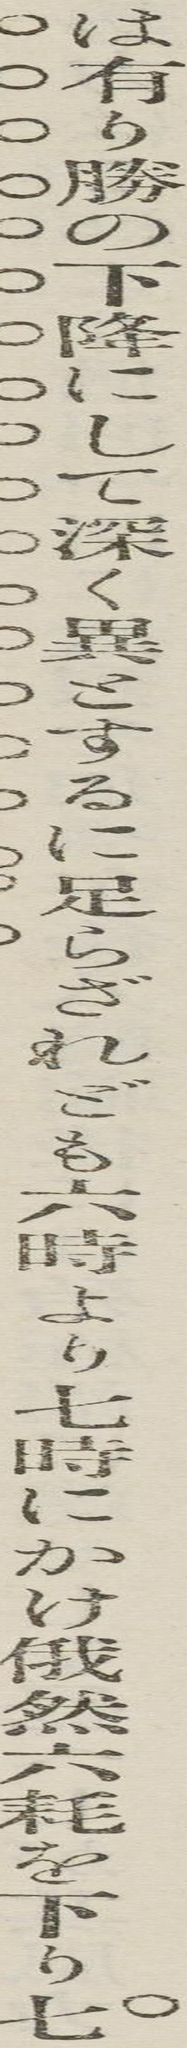は有り勝の下降にして深く異とするに足らざれども六時より七時にかけ俄然六粍を下リ七
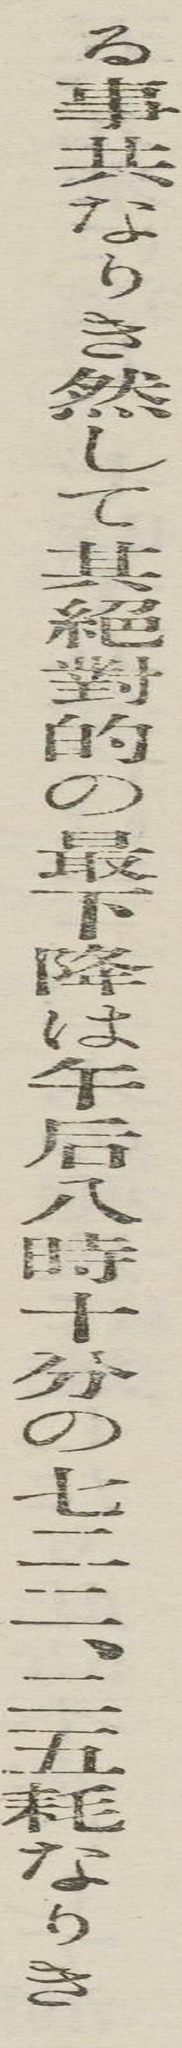る事共なりき然して其絶対的の最下降は午后八時十分の七二二、二五粍なりき
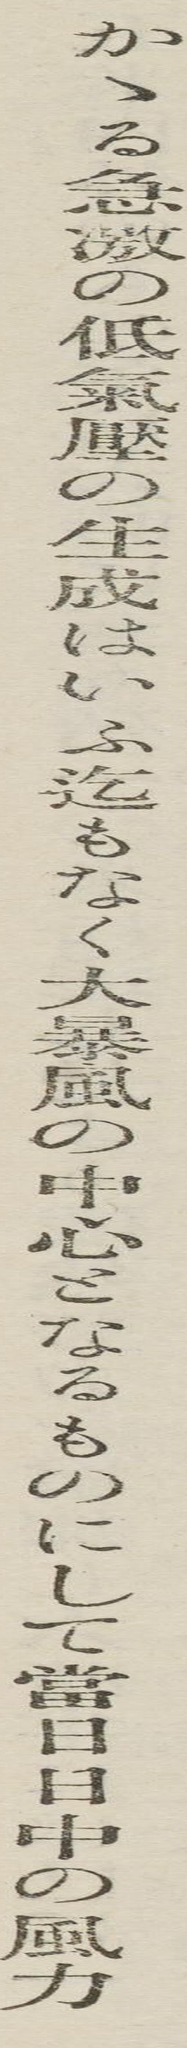かゝる急激の低気圧の生成はいふ迄もなく大暴風の中心となるものにして当日日中の風力

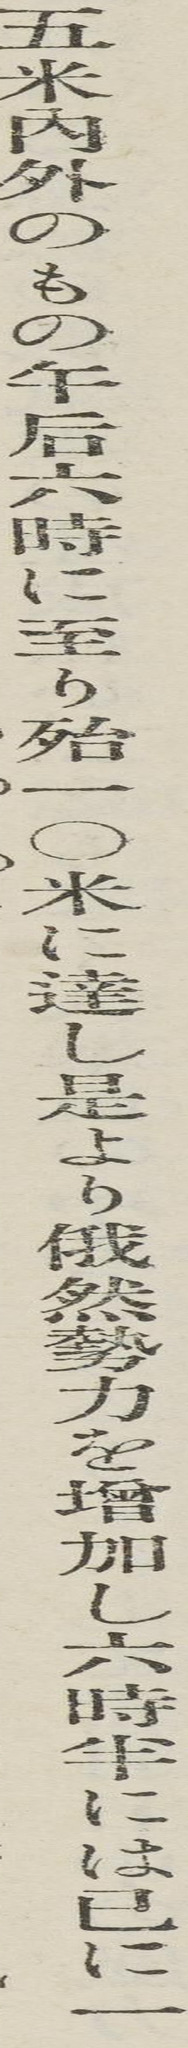五米内外のもの午后六時に至り殆一〇米に達し是より俄然勢力を増加し六時半には已に一
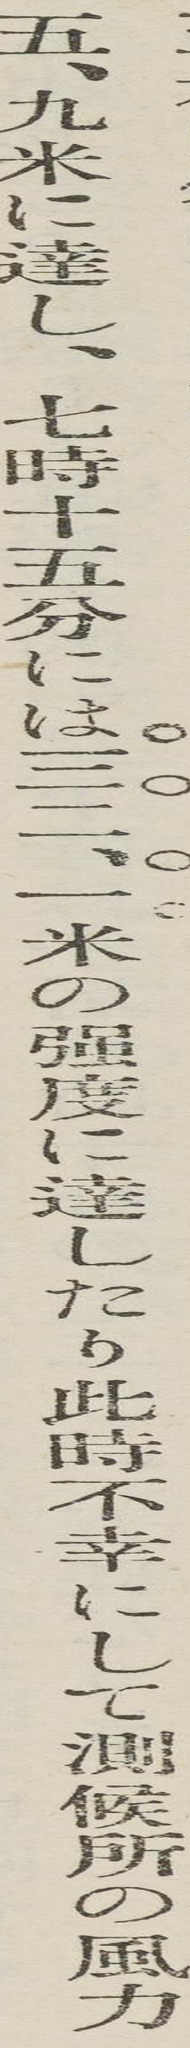五、九米に達し、七時十五分には三二、一〇〇〇〇米の強度に達したり此時不幸にして測候所の風力
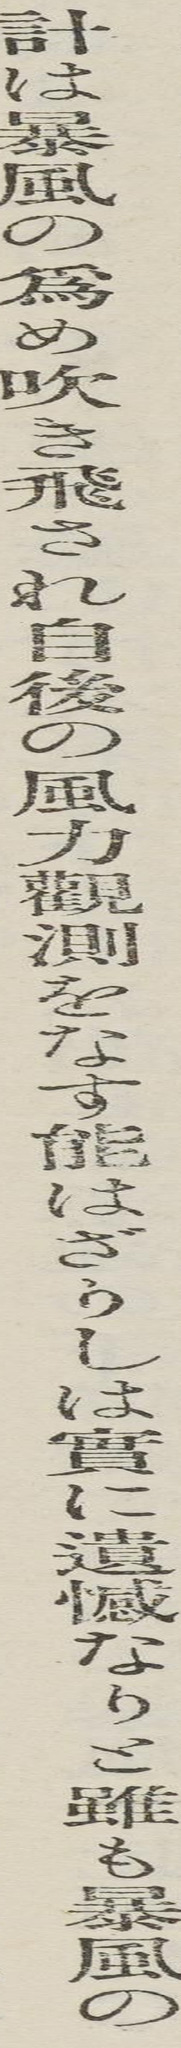計は暴風の為め吹き飛され自後の風力観測をなす能はざりしは実に遺憾なりと雖も暴風の
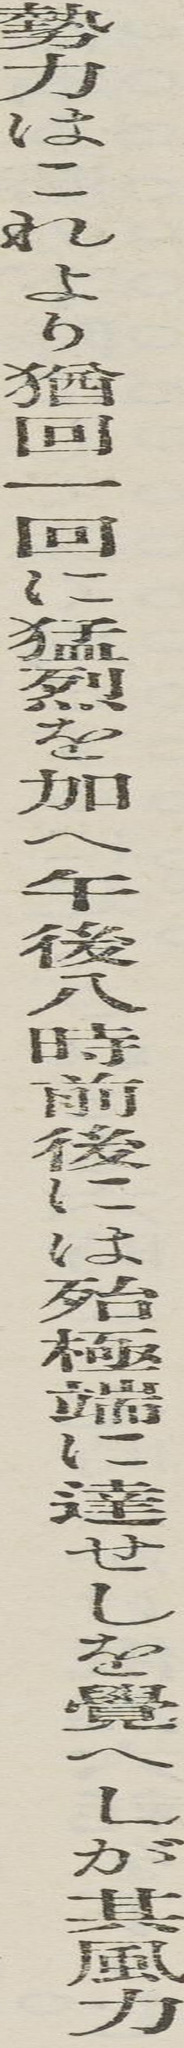精力はこれより猶回一回に猛烈を加へ午後八時前後には殆極端に達せしを覚へしが其風力
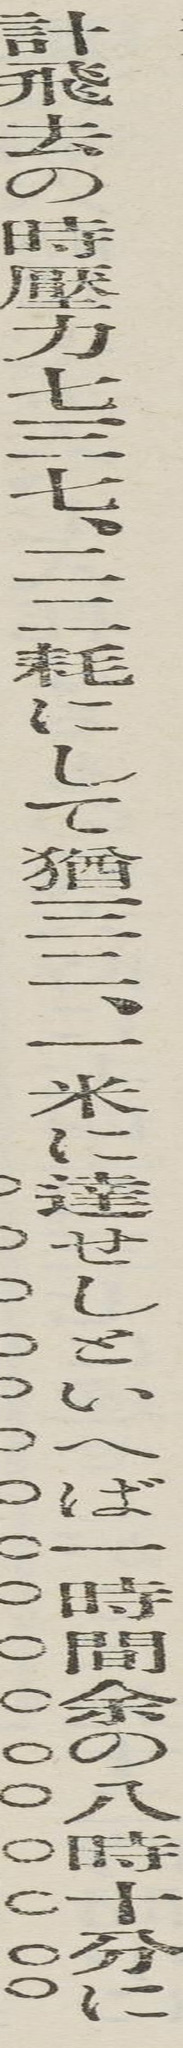計飛去の時圧力七三七、二二粍にして猶三二、一米に達せしといへば一時間余の八時十分に
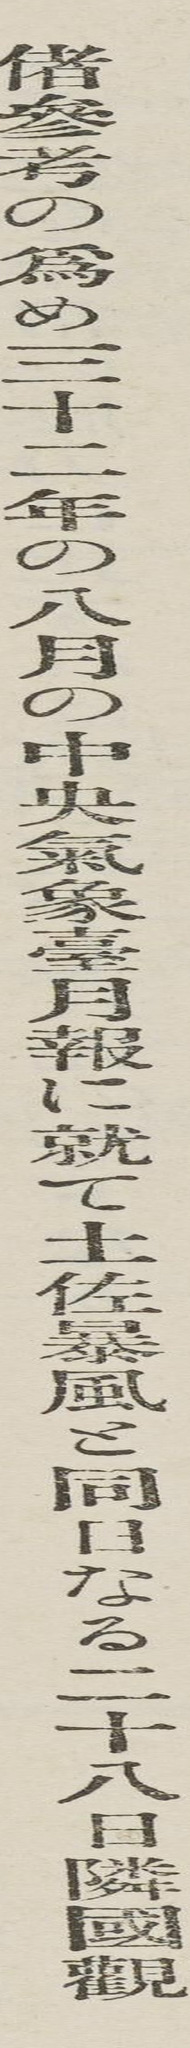偖参考の為め三十二年の八月の中央気象台月報に就て土佐暴風と同日なる二十八日隣国観
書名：土佐古今ノ地震
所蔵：東京大学地震研究所図書室 Earthquake Research Institute Library, The University of Tokyo, JAPAN
